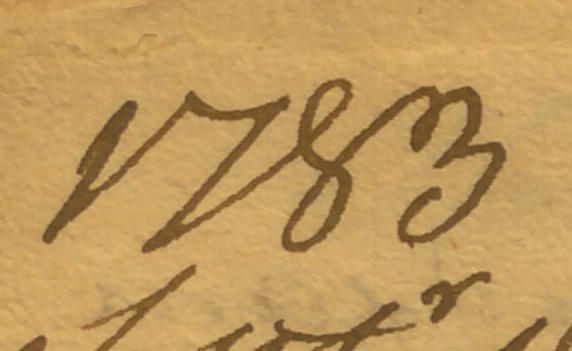1783
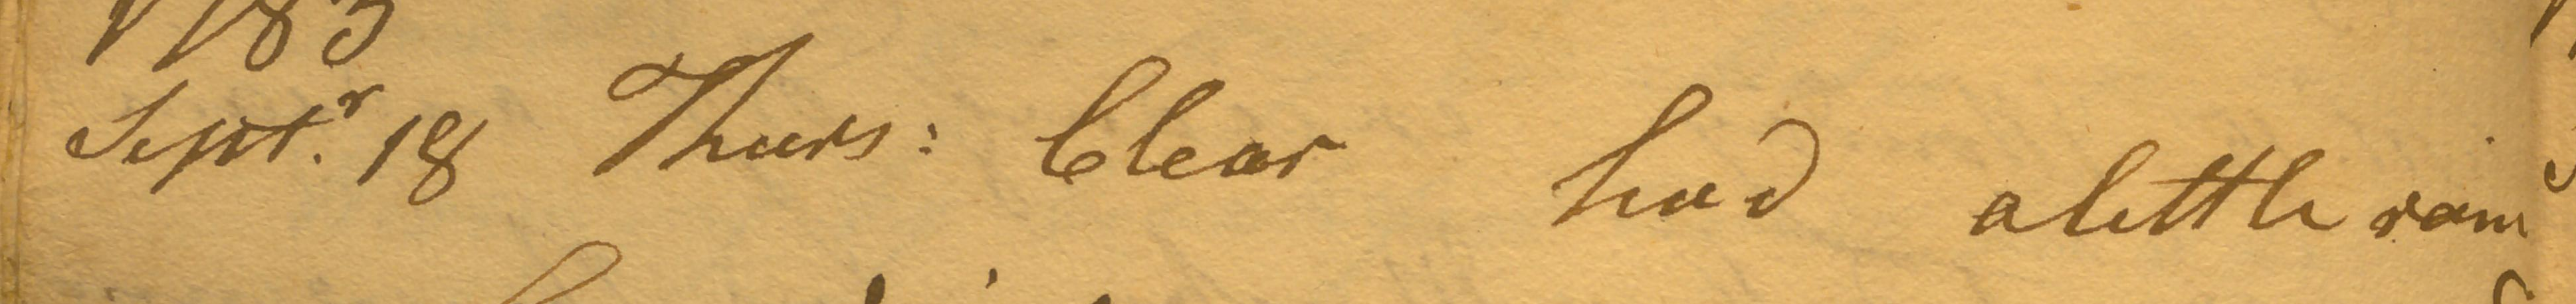Sept^r. 18 Thurs. Clear had a little rain
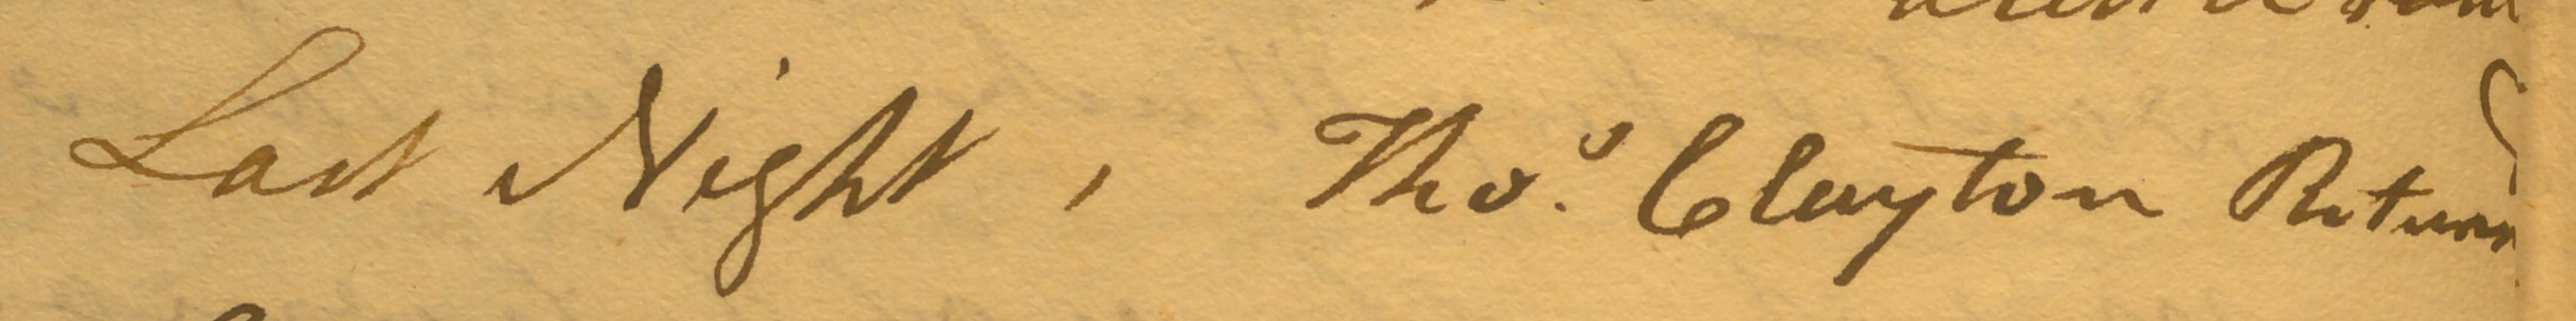Last Night, Tho^s. Clayton Return^d
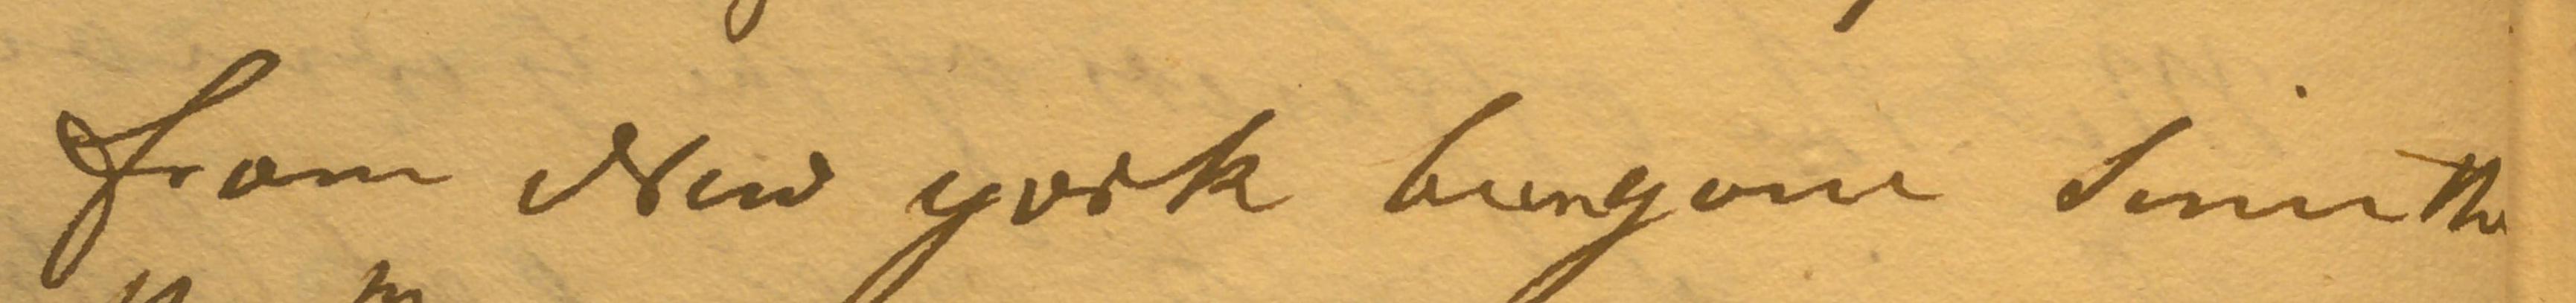from New york been gone since the
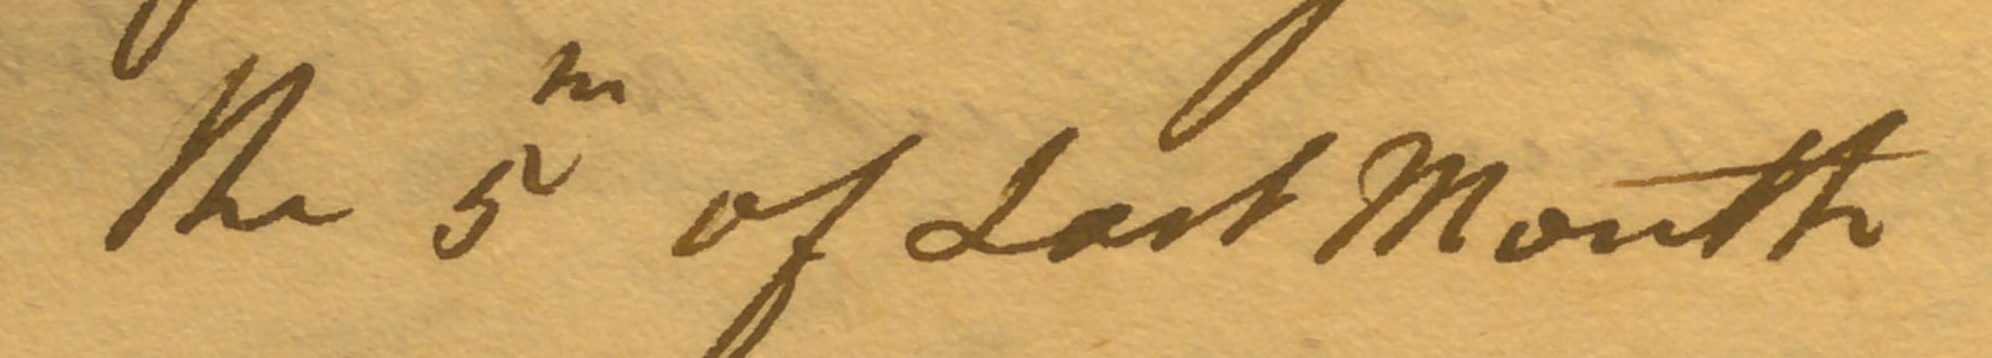the 5^th of Last Month
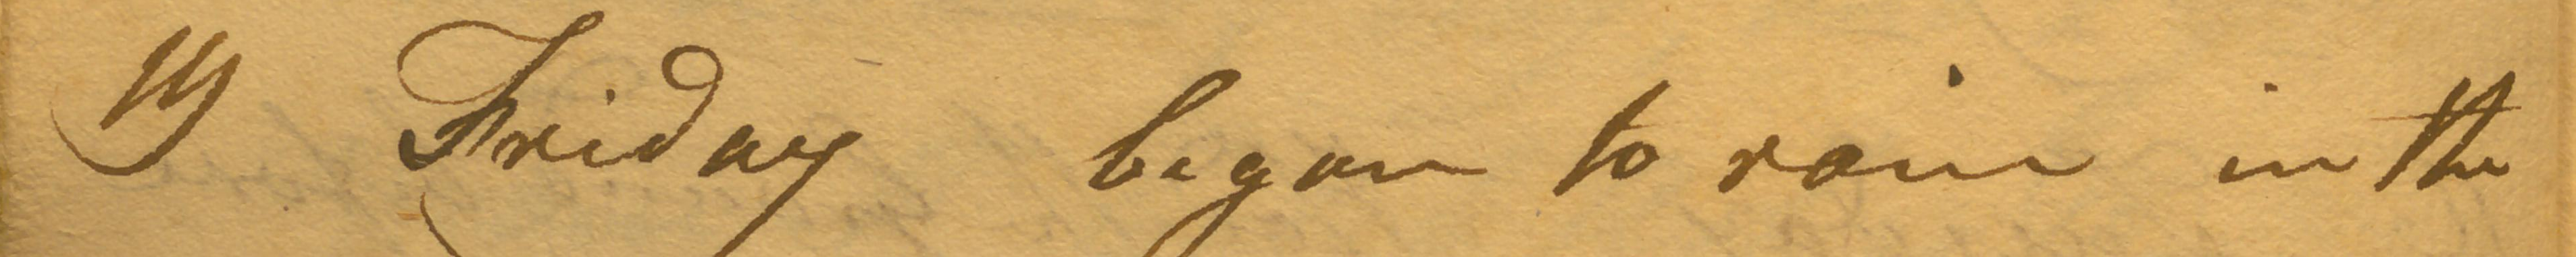19 Friday began to rain in the
